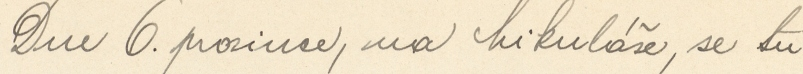Dne 6. prosince, na Mikuláše, se tu
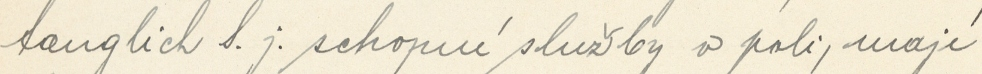tanglich t. j. schopní služby v poli, mají
